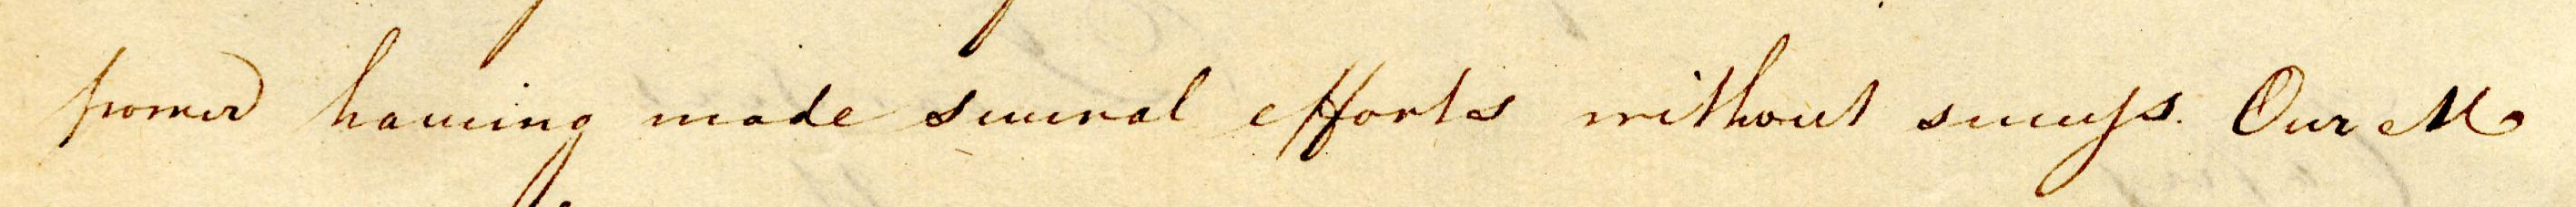power having made several efforts without success Our M
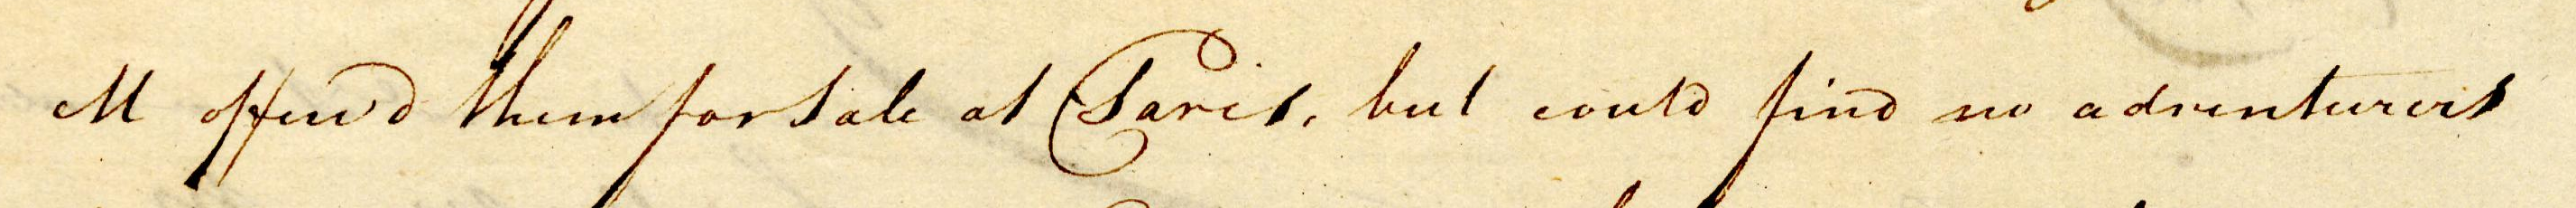M offer'd them for Sale at Paris but could find no adventurers
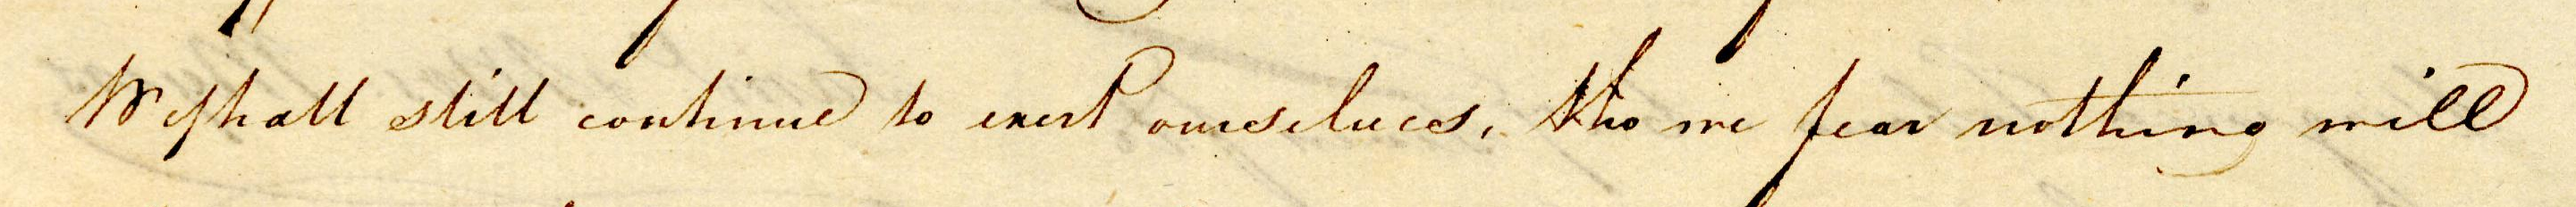We shall still continue to exert ourselves, tho we fear nothing will
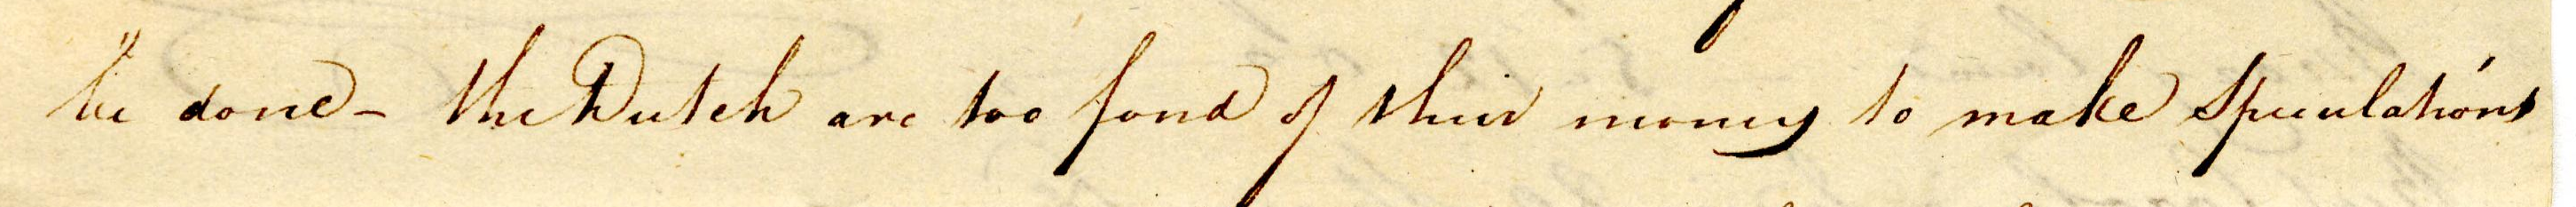be done.- the Dutch are too fond of their money to make Speculations
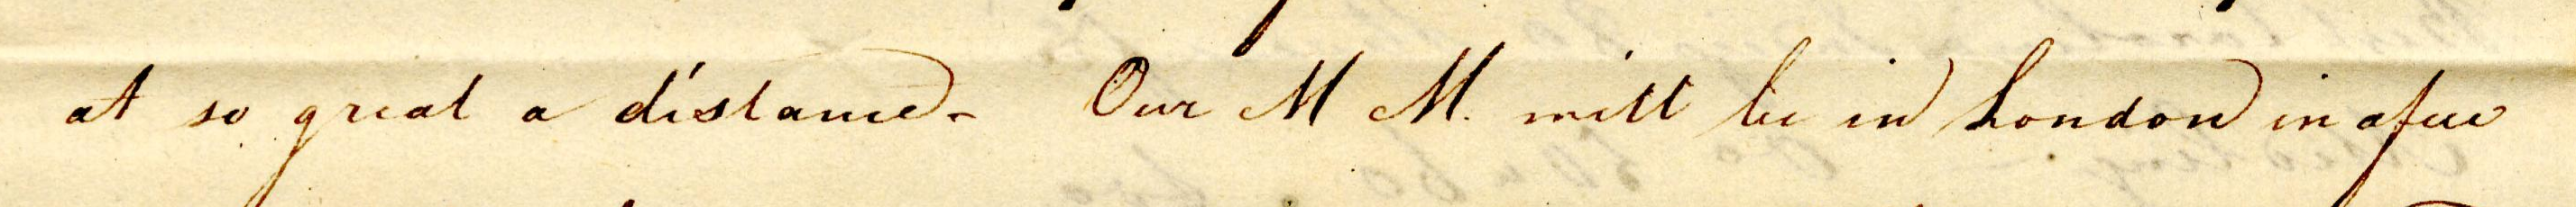at so great a distance. Our M M will be in London in a few
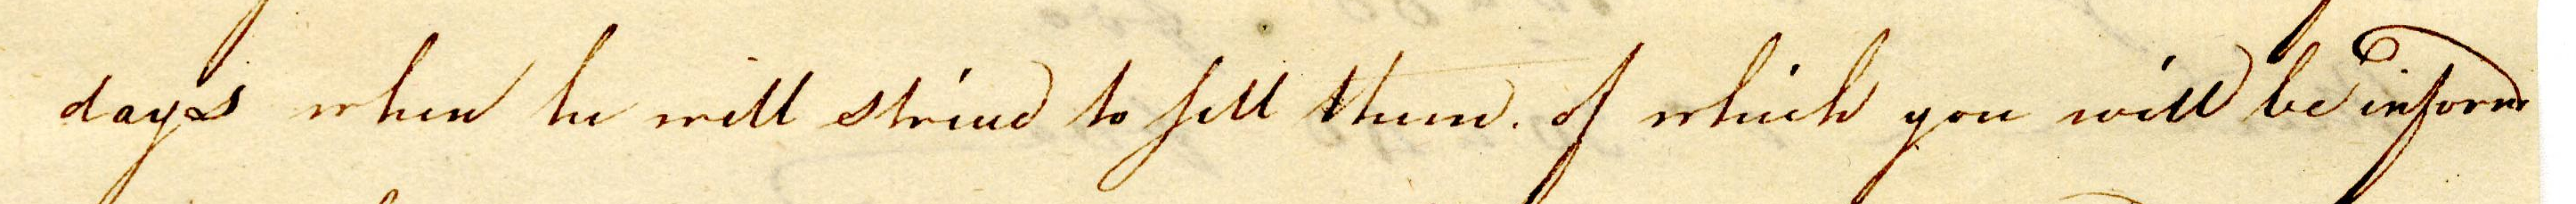days when he well strive to sell them of which you will be informd
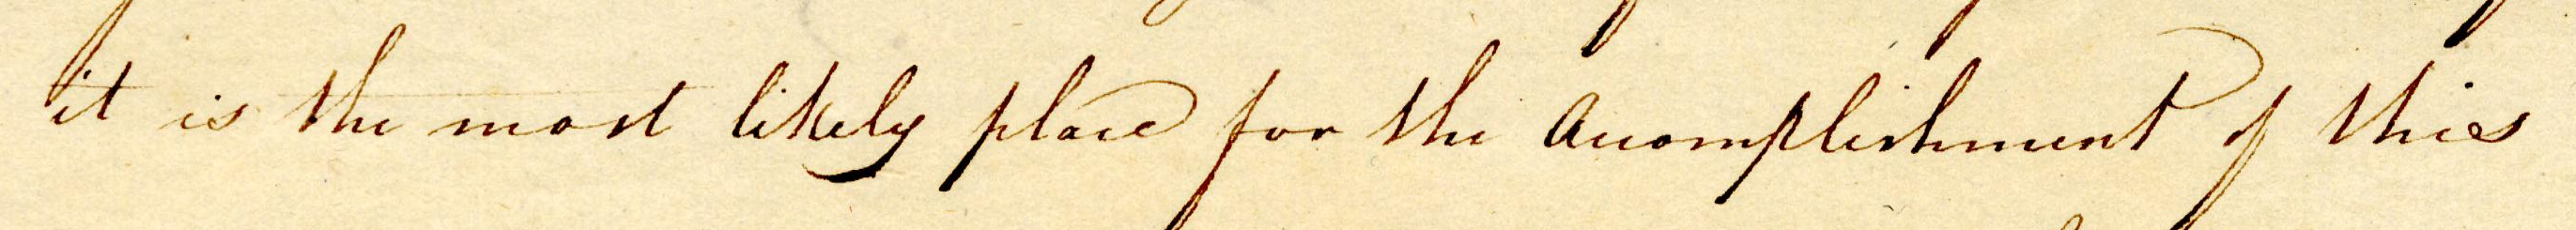it is the most likely place for the accomplishment of this
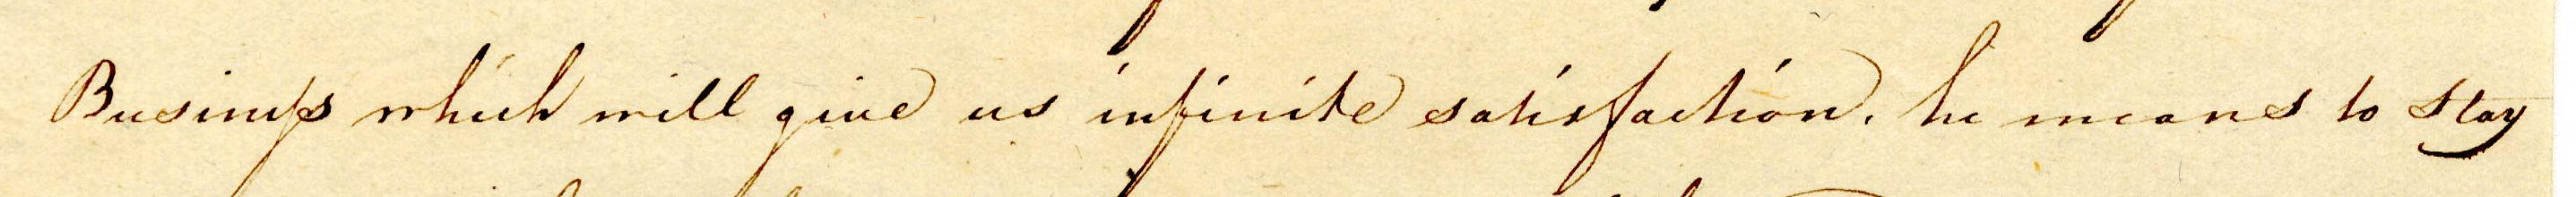Business which will give us infinite satisfaction, he means to stay
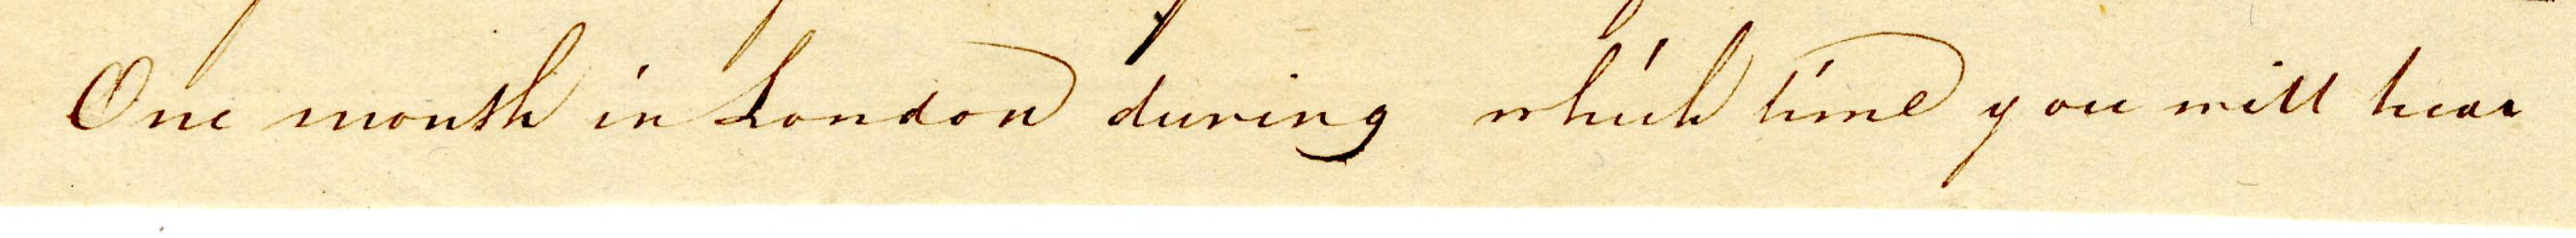One month in London during which time you will hear
